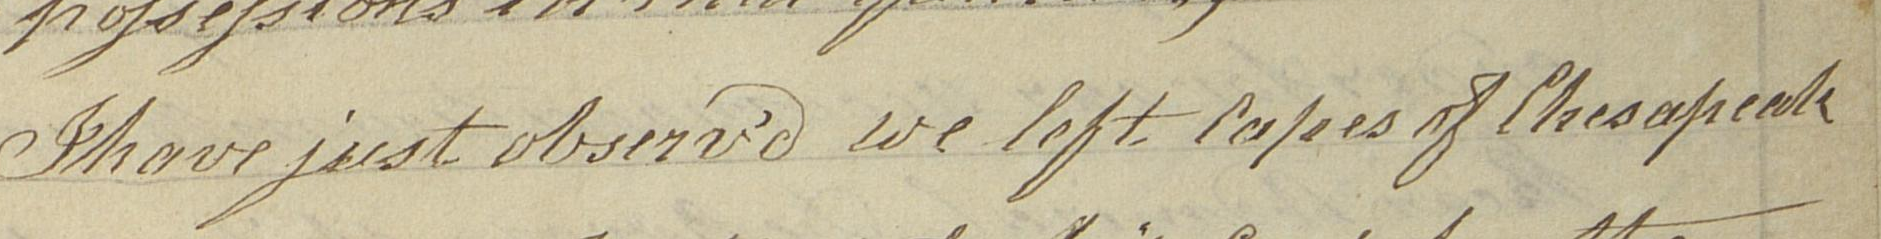I have just observ'd we left Capes of Chesapeak
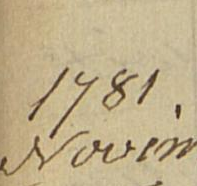1781
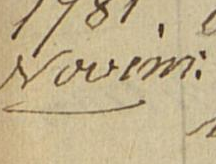Novem.
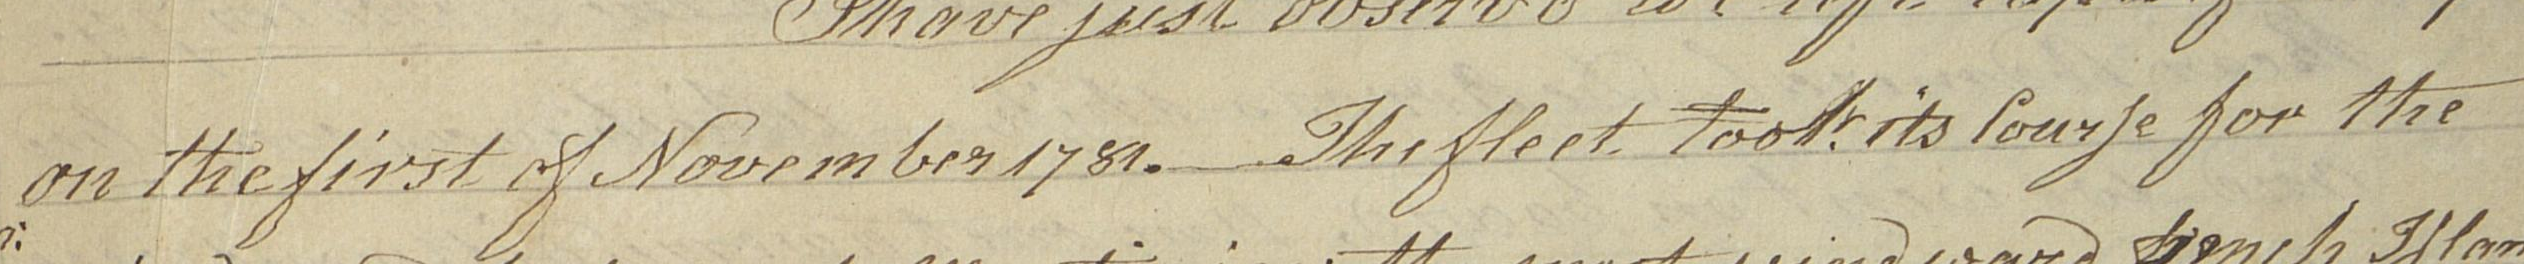on the first of November 1781. The fleet took its Course for the
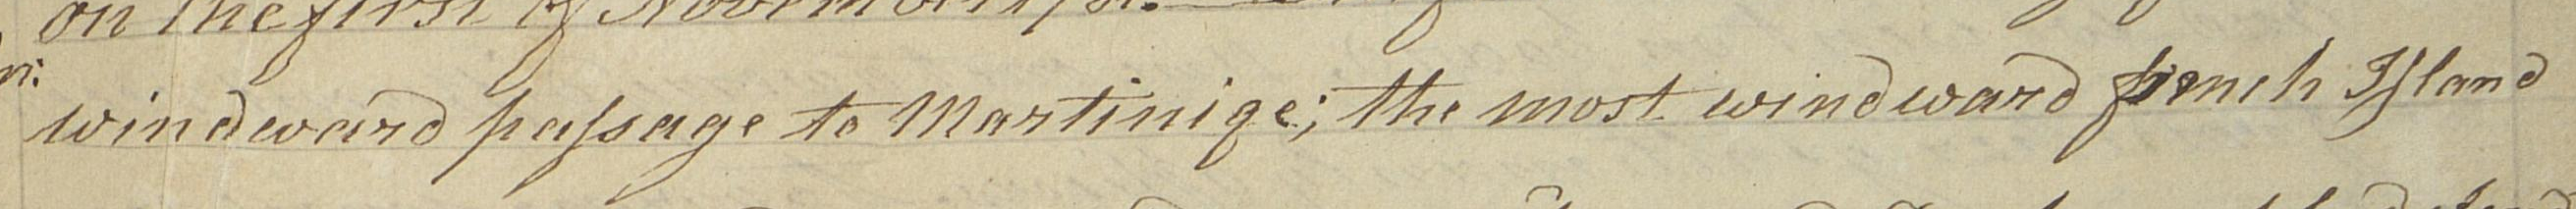windward passage to Martiniqe; the most windward French Island
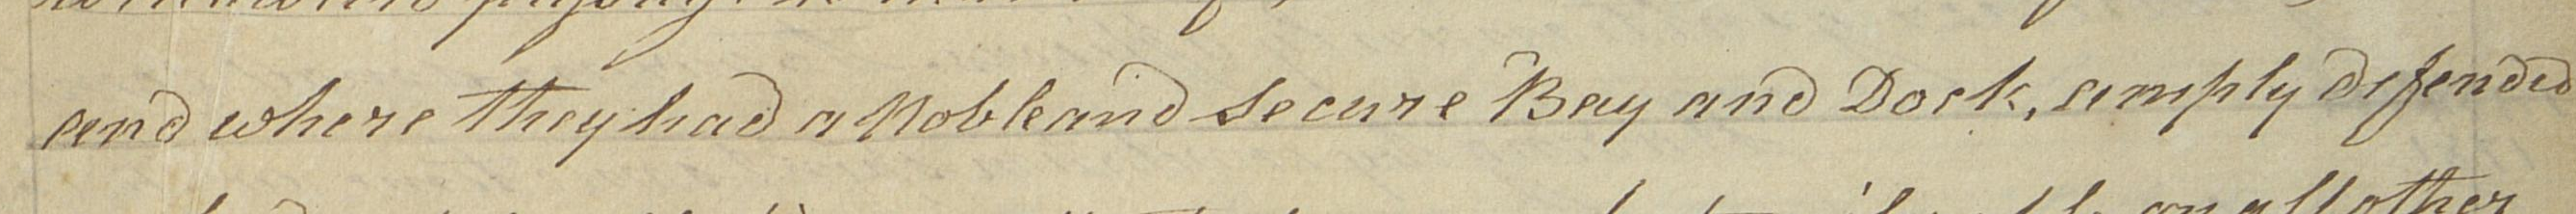and where thy had a Noble and secure Bay and Dock amply defended
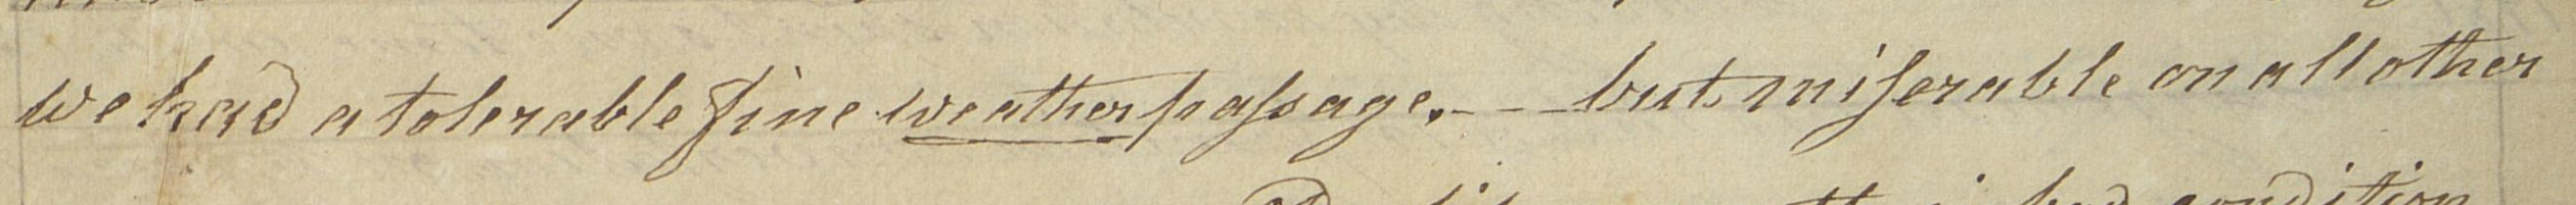we had a tolerable fine weather usage. but miserable on all other
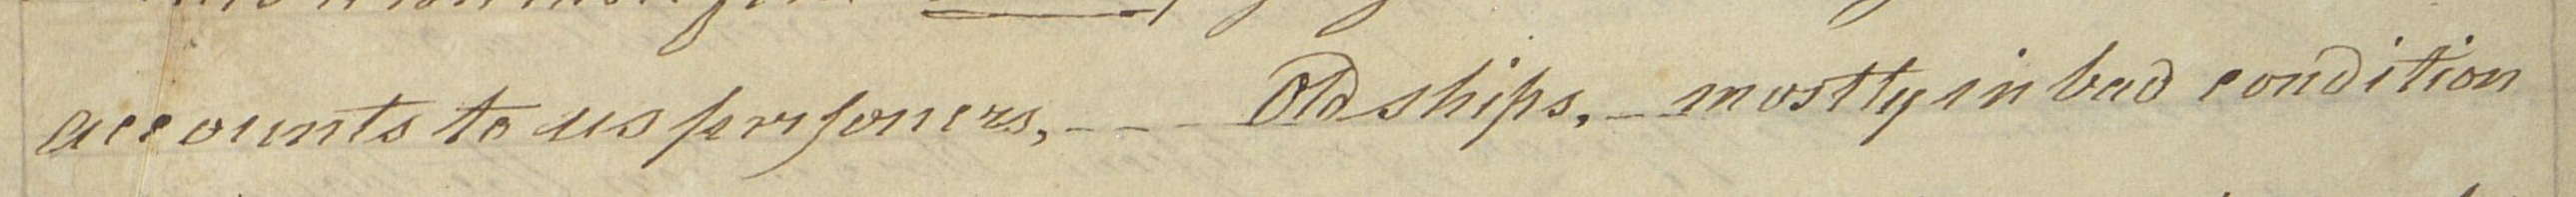accounts to us prisoners, Old ships, mostly in bad condition
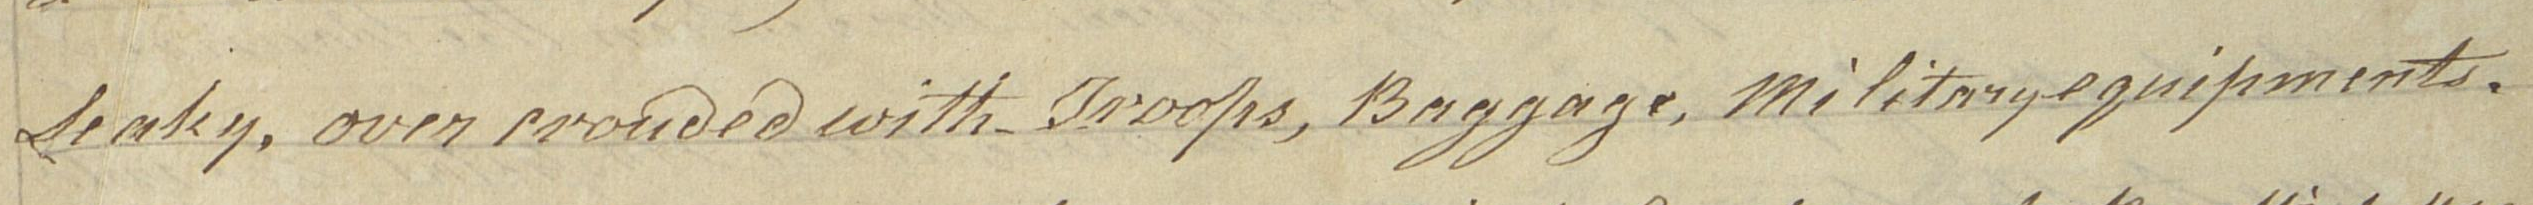leaky, over crouded with Troops, Baggage, Military equipments.
